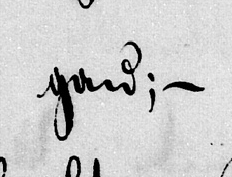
gau; –
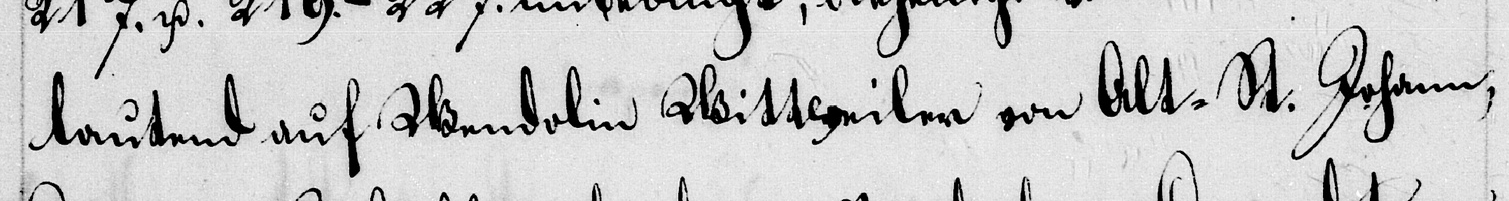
lautend auf Wendolin Wittweiler von Alt-St. Johann,
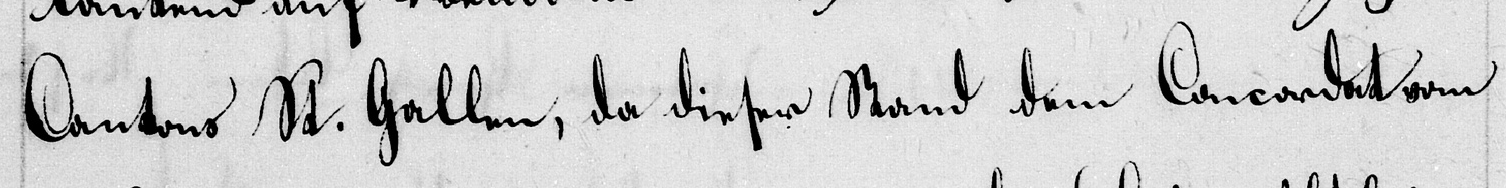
Cantons St. Gallen, da dieser Stand dem Concordat vom
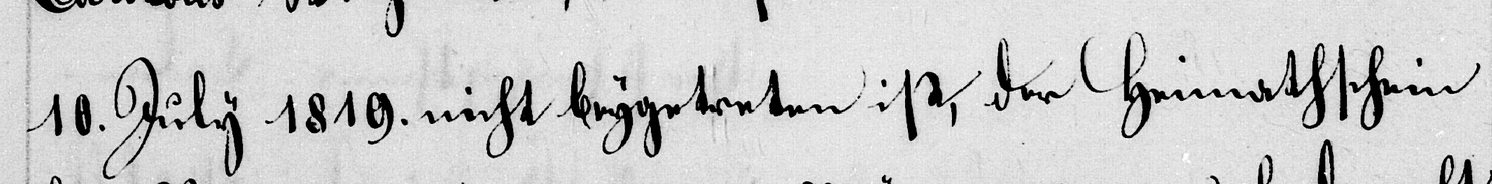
10. July 1819. nicht beygetreten ist, der Heimathschein
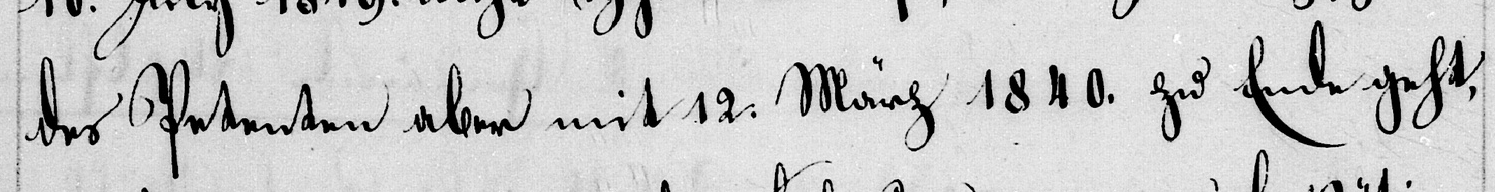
des Petenten aber mit 12. März 1840. zu Ende geht,
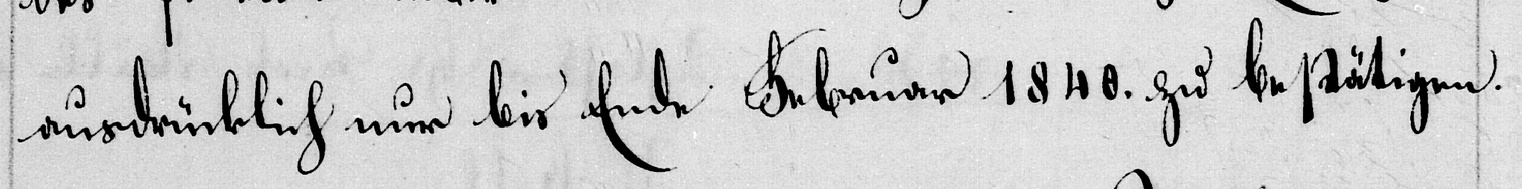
ausdrücklich nur bis Ende Februar 1840. zu bestätigen.
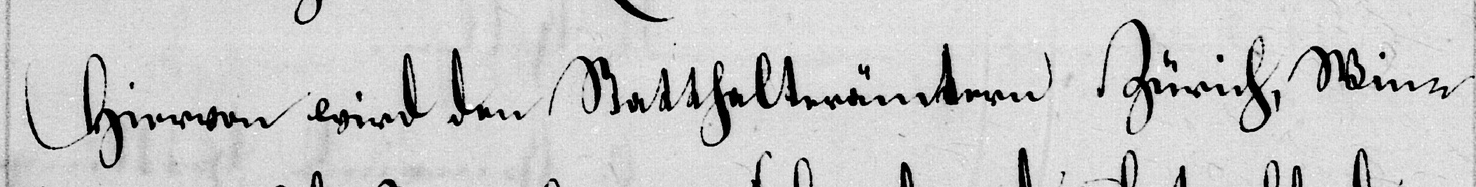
Hiervon wird den Statthalterämtern Zürich, Win¬
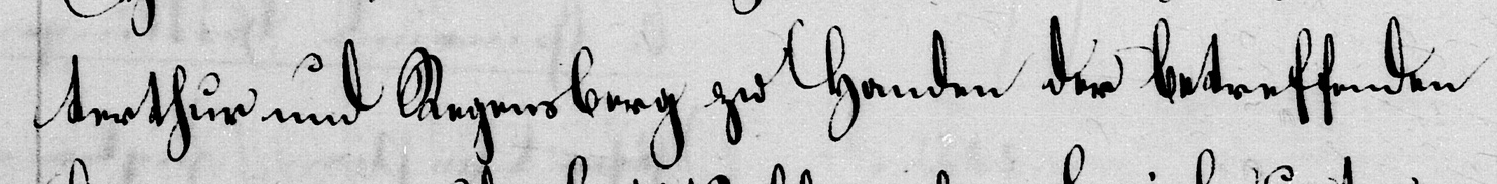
terthur und Regensberg zu Handen der betreffenden
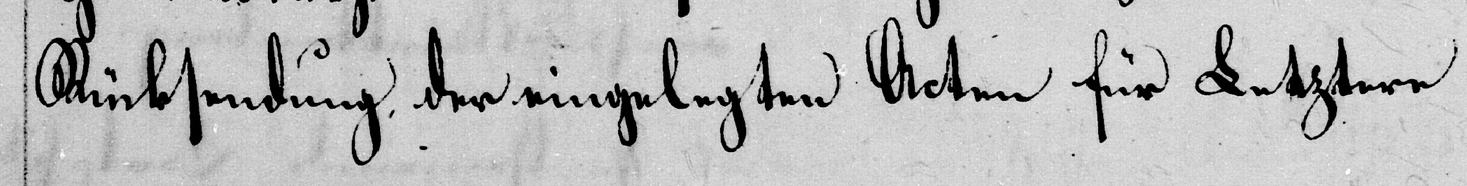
Rücksendung der eingelegten Acten für Letztere
